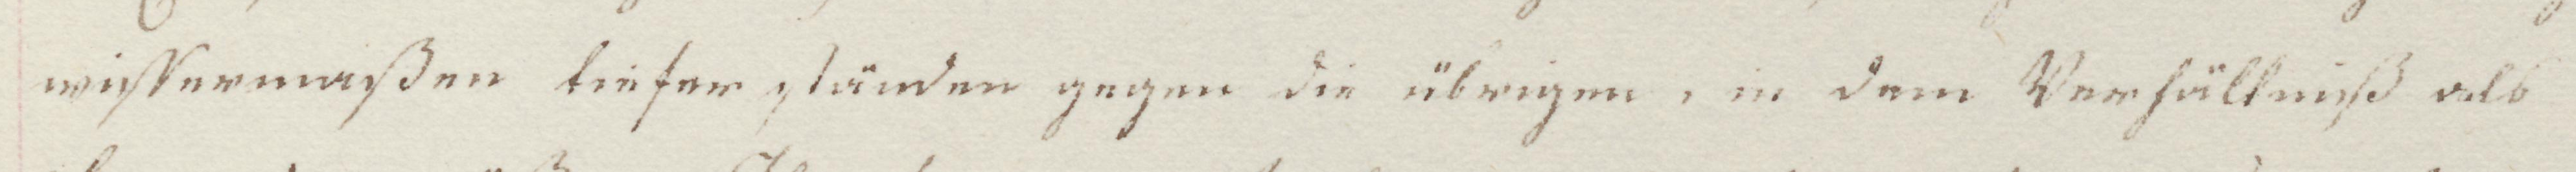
wissermaßen tiefer ständen gegen die übrigen, in dem Verhältniß als
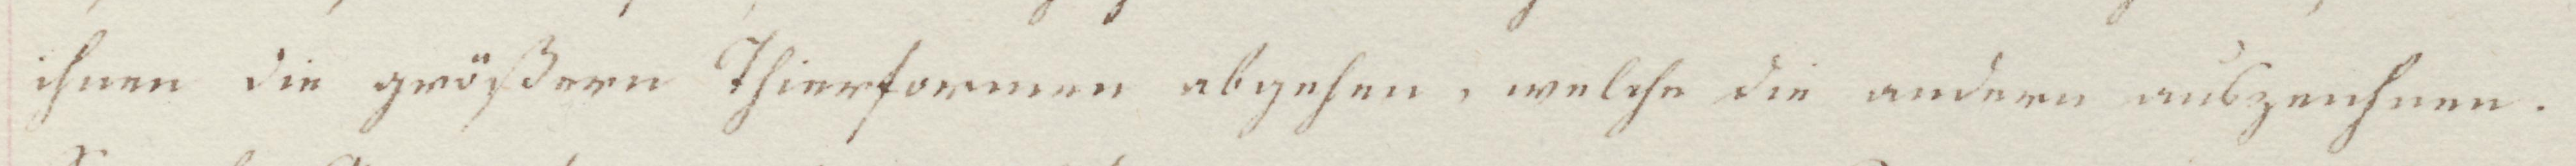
ihnen die größern Thierformen abgehen, welche die andern auszeichnen.
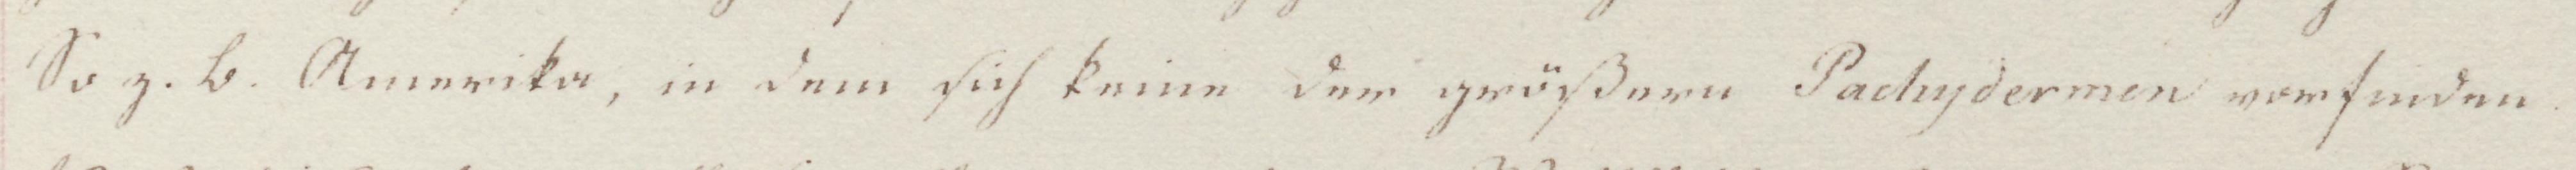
So z. B. Amerika, in dem sich keine der größern Pachydermen vorfinden.
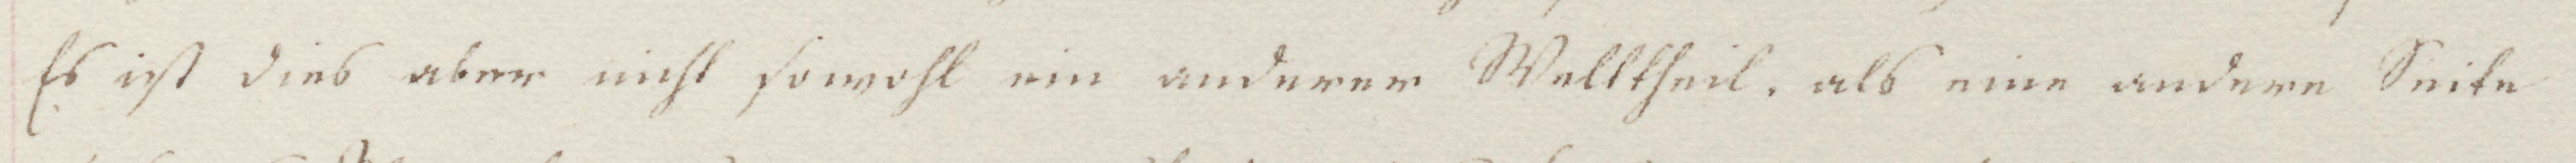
Es ist dies aber nicht sowohl ein anderer Welttheil, als eine andere Seite
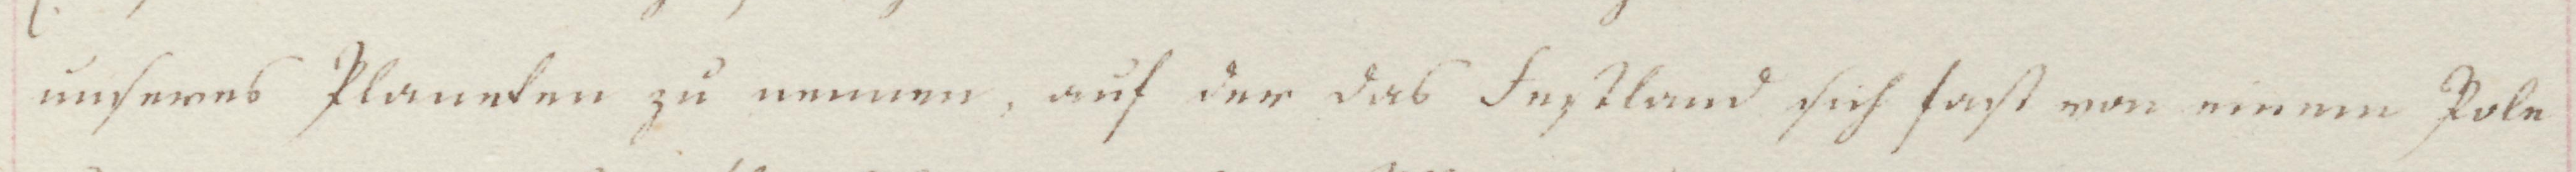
unseres Planeten zu nennen, auf der das Festland sich fast von einem Pole
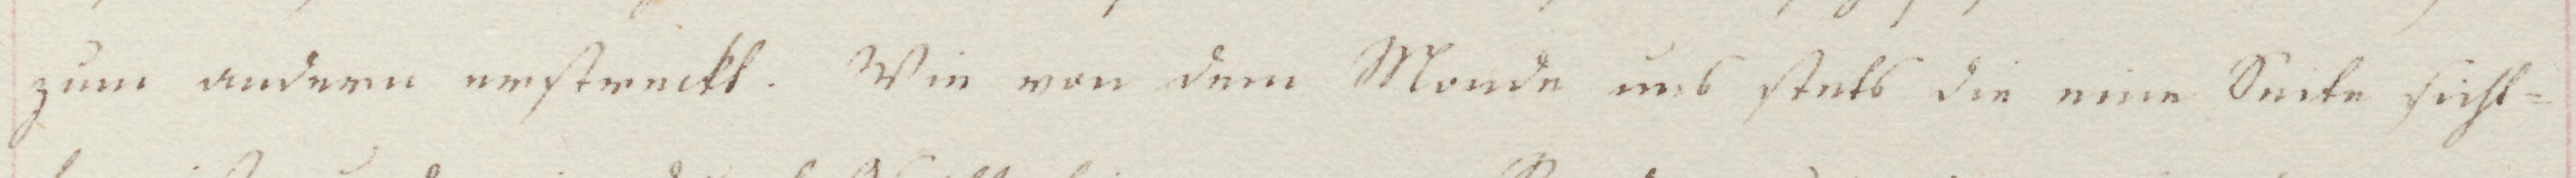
zum andern erstreckt. Wie von dem Monde uns stets die eine Seite sicht-
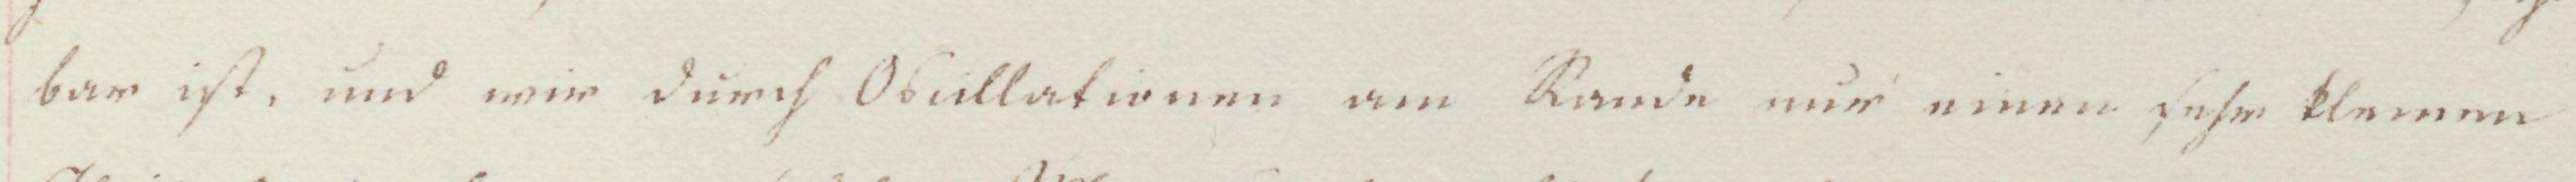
bar ist, und wir durch Oscillationen am Rande nur einen sehr kleinen
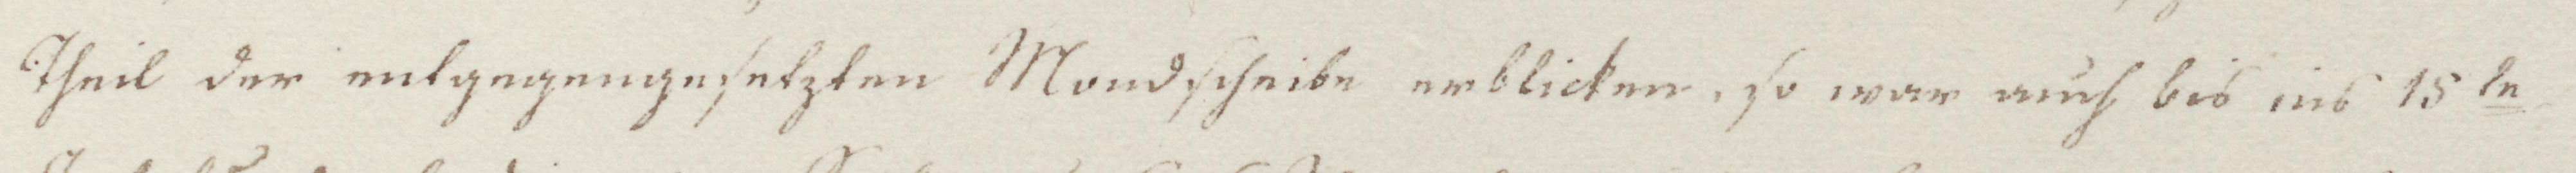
Theil der entgegengesetzten Mondscheibe erblicken, so war auch bis ins 15te
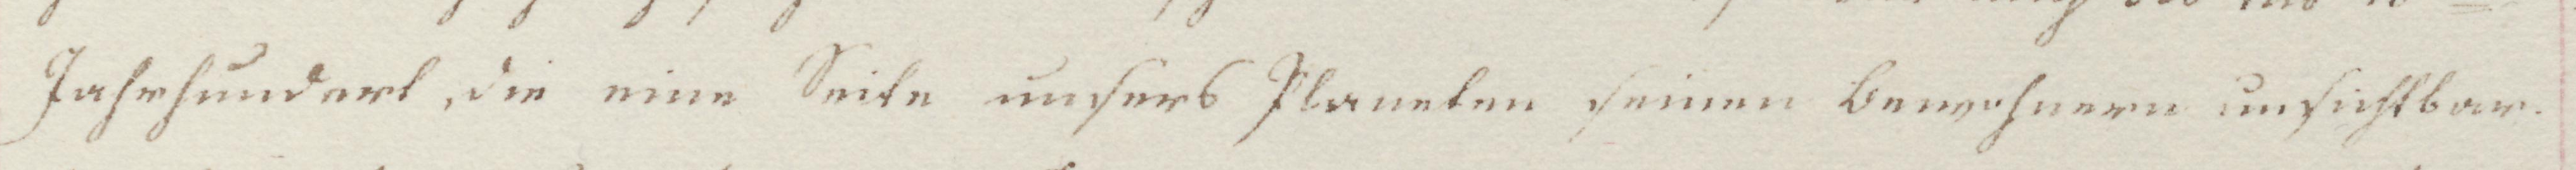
Jahrhundert, die eine Seite unsers Planeten seinen Bewohnern unsichtbar.
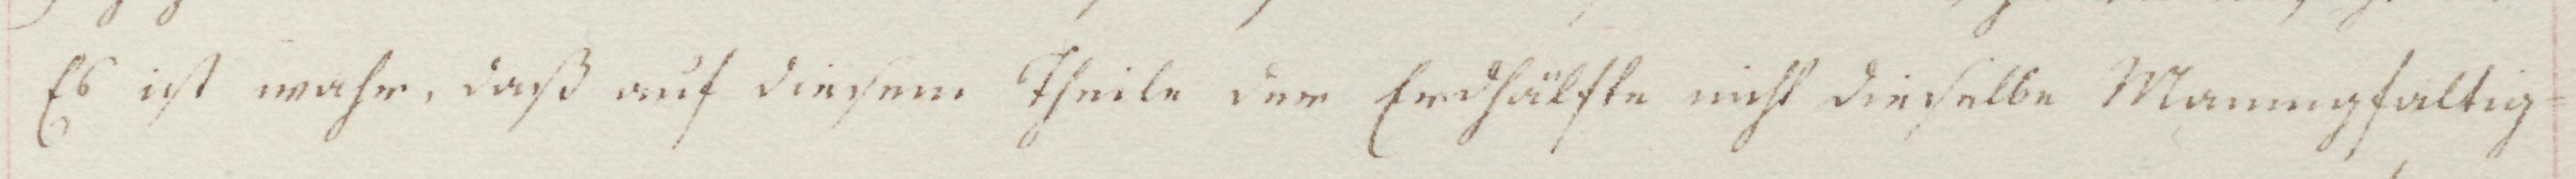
Es ist wahr, daß auf diesem Theile der Erdoberfläche nicht dieselbe Mannigfaltig-
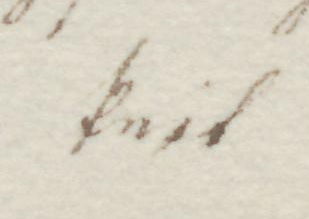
keit
